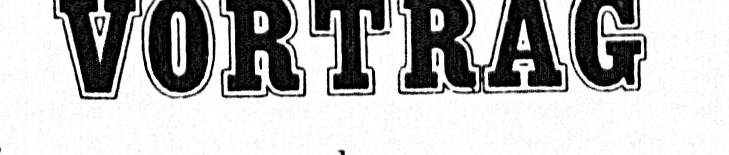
VORTRAG
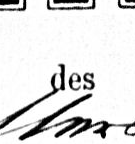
des
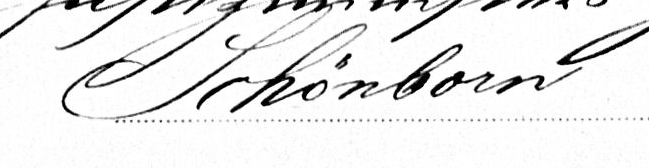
Schönborn
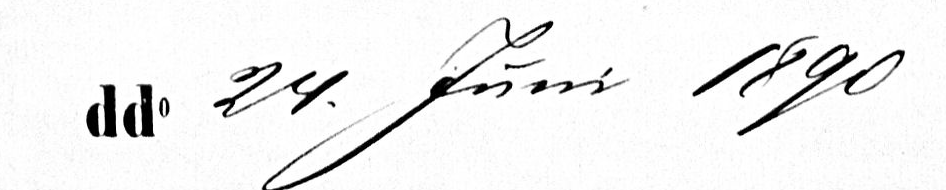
dd° 24. Juni 1890
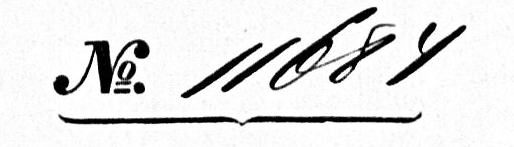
Nr. 11684
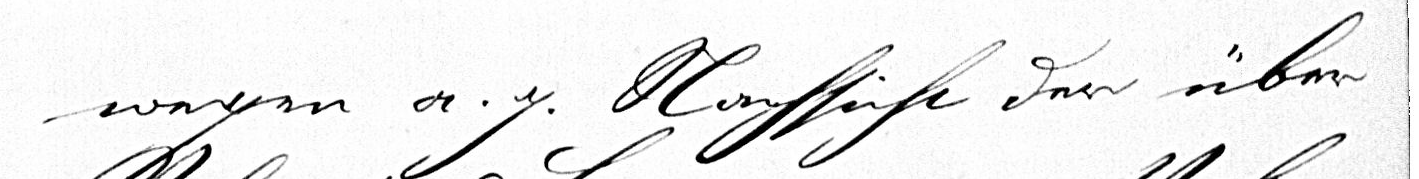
wegen a. g. Nachsicht der über
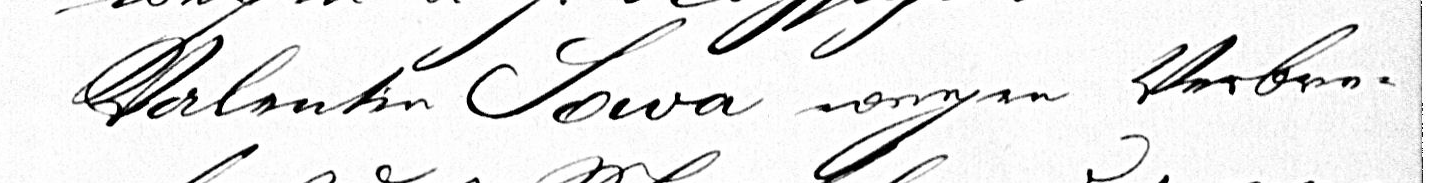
Valentin Sowa wegen Verbre¬
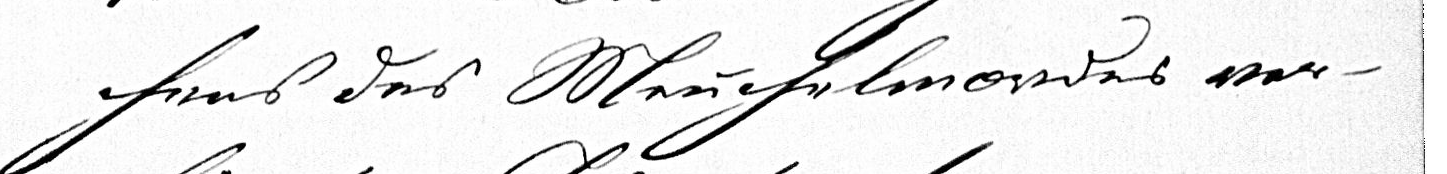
chens des Meuchelmordes ver¬
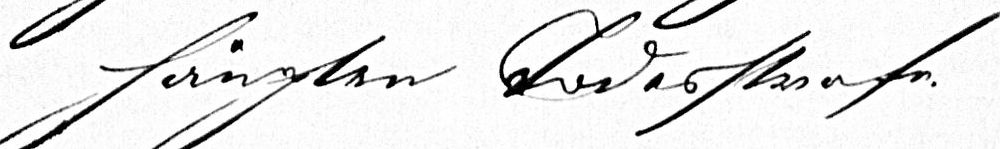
hängten Todesstrafe.
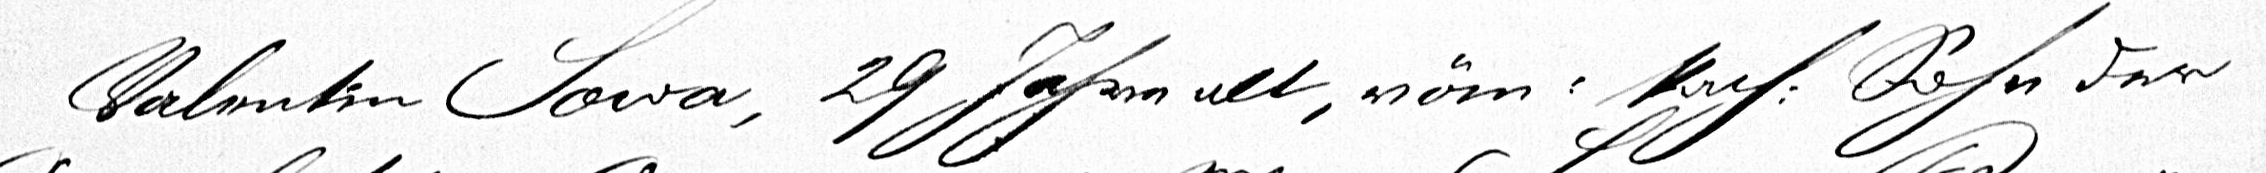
Valentin Sowa, 29 Jahre alt, röm. kath. Sohn der
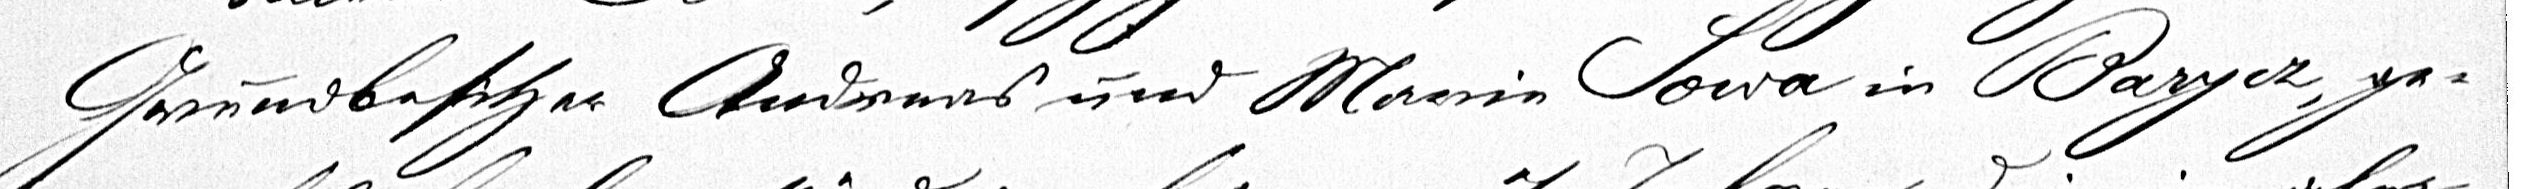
Grundbesitzer Andreas und Marie Sowa in Barycz, ge¬
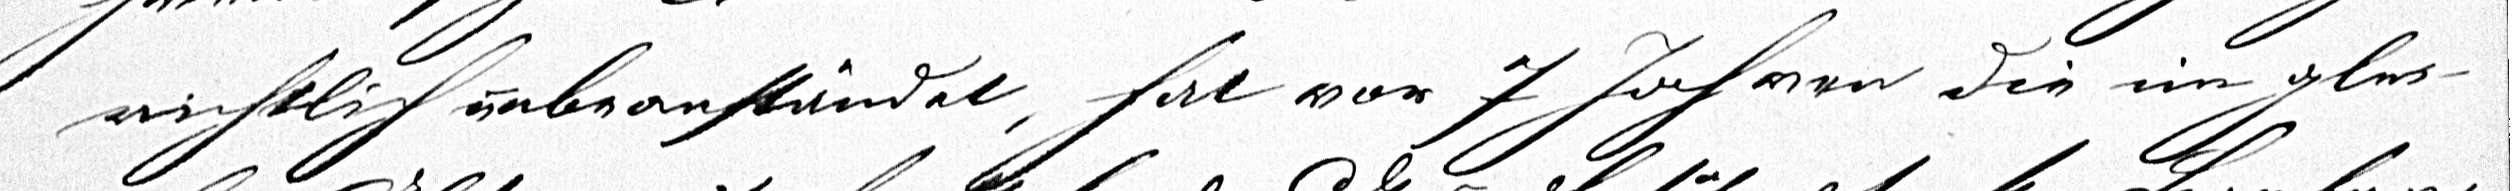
richtlich unbeanständet, hat vor 7 Jahren die ein glei¬
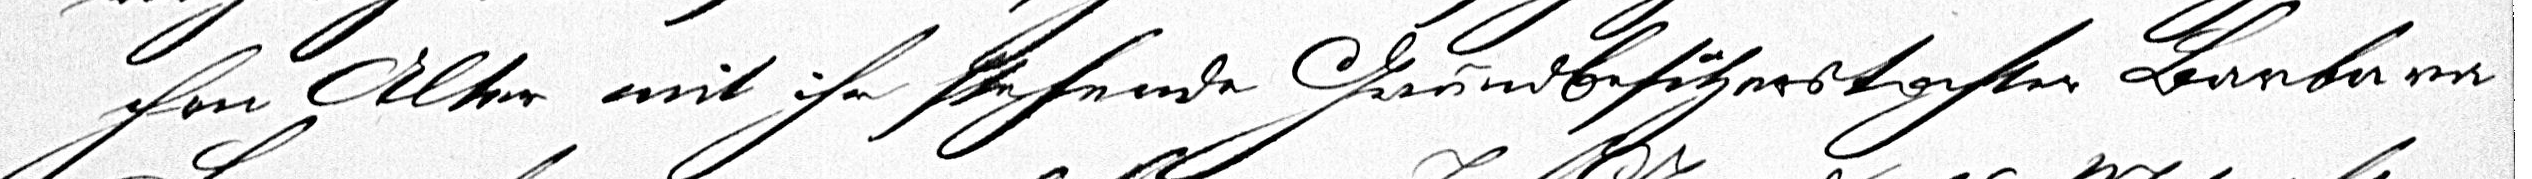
chen Alter mit ihr stehende Grundbesitzerstochter Barbara
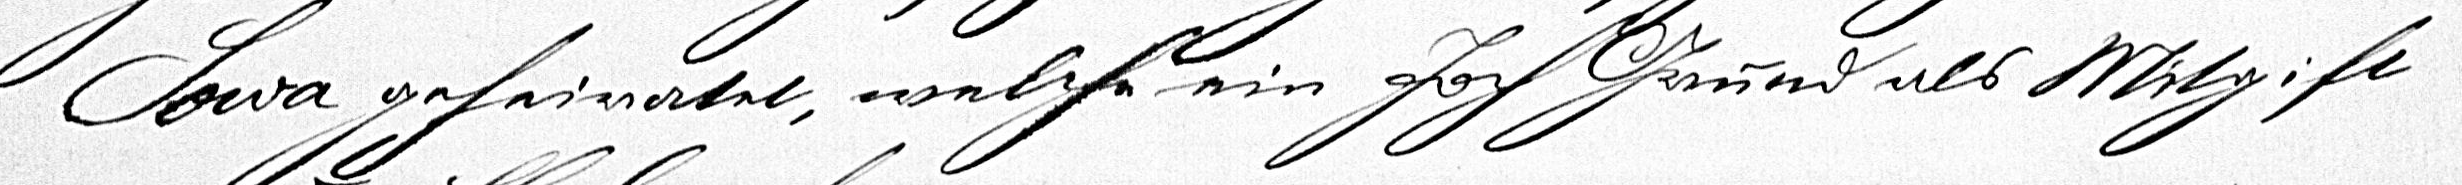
Sowa geheiratet, welche ein Joch Grund als Mitgift
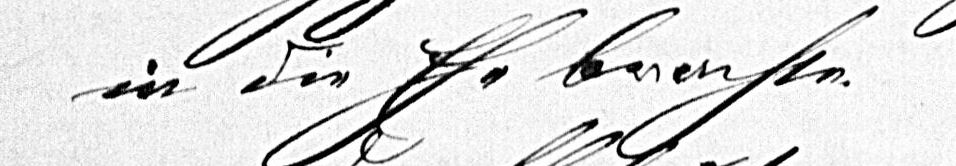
in die Ehe brachte.
